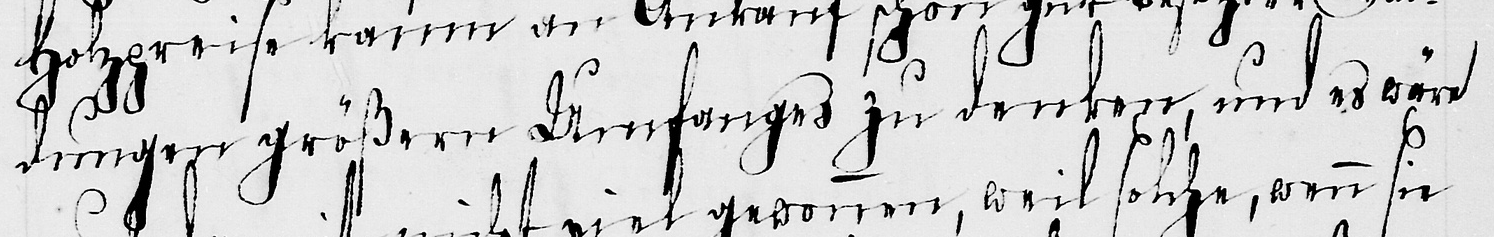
dungen größern Umfanges zu denken, und es wäre
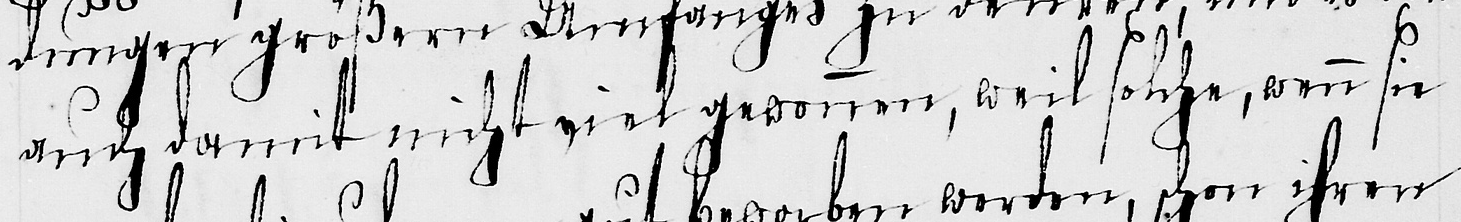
auch damit nicht viel gewonnen, weil solche, wenn sie
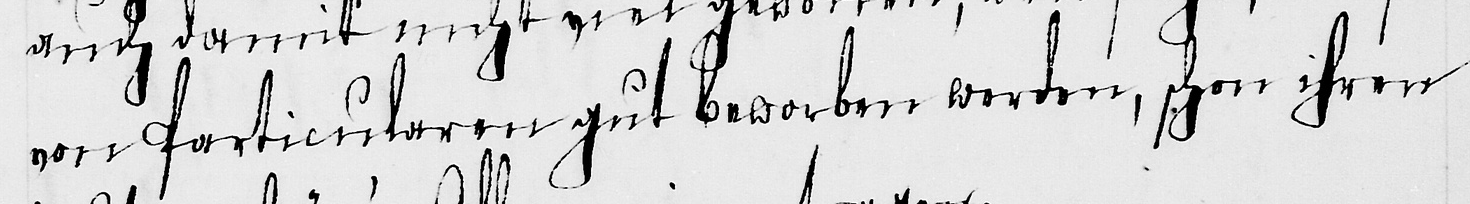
von Particularen gut beworben werden, schon ihren
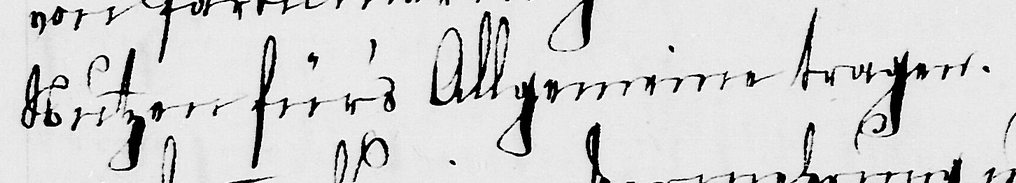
Nutzen für’s Allgemeine tragen.
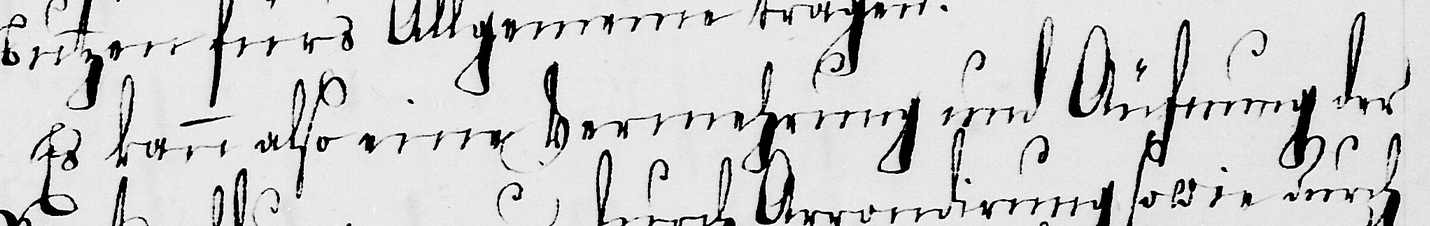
Es kann also eine Vermehrung und Äufnung der
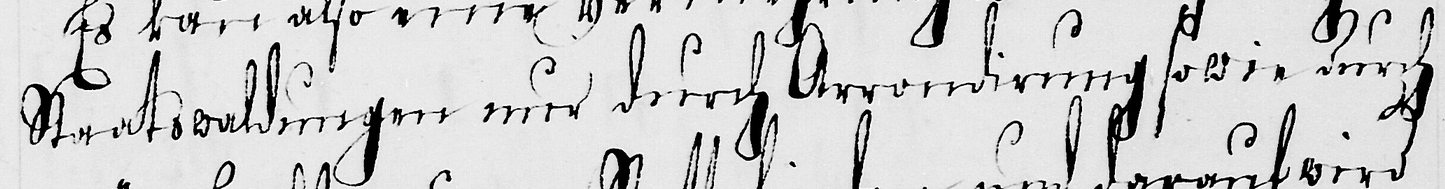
Staatswaldungen nur durch Arrondierung sowie durch
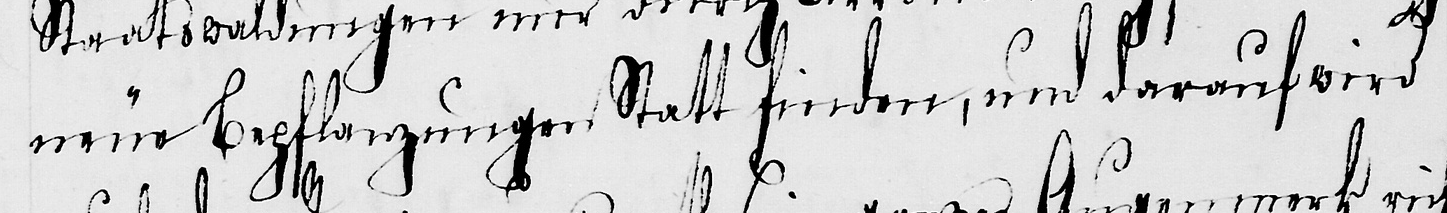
neue Bepflanzungen Statt finden, und darauf wird
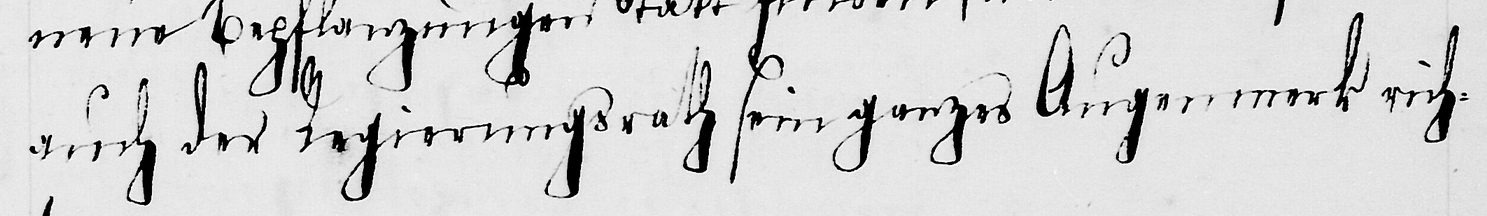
auch der Regierungsrath sein ganzes Augenmerk rich¬
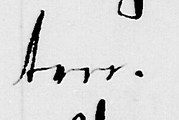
ten.
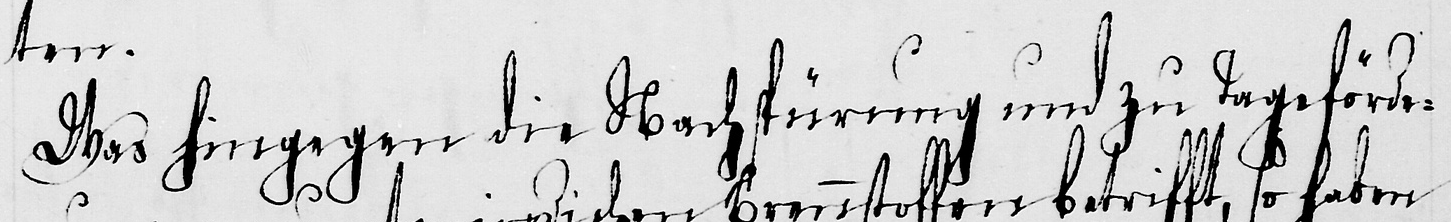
Was hingegen die Nachspürung und zu Tageförde¬
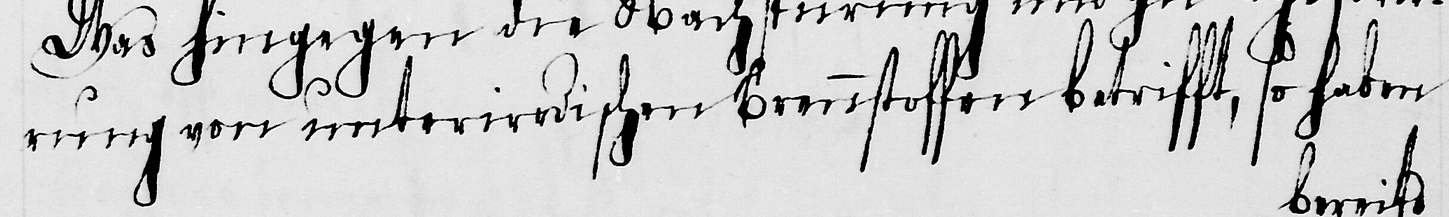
rung von unterirdischen Brennstoffen betrifft, so haben
